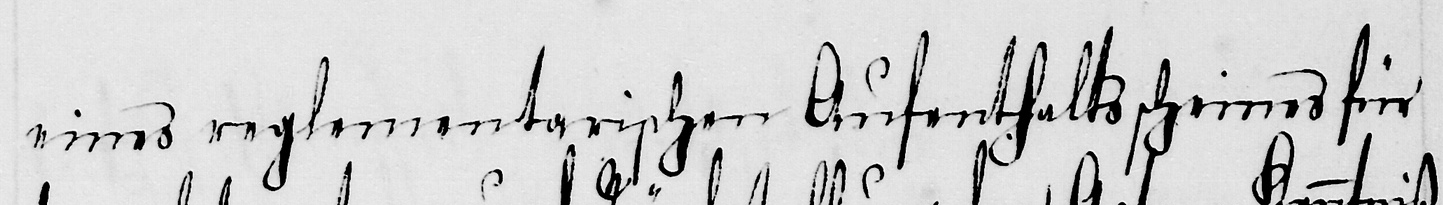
eines reglementarischen Aufenthaltsscheines für
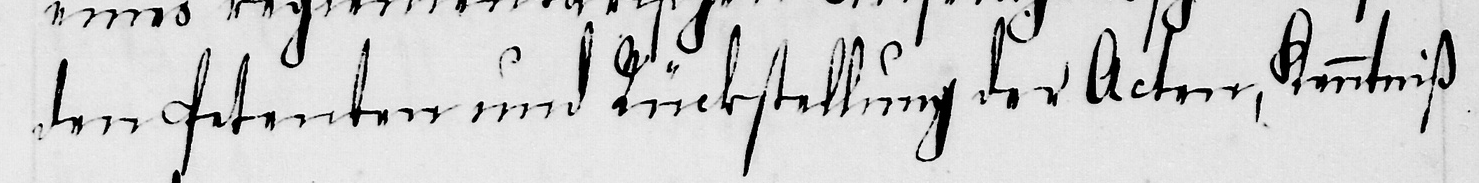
den Petenten und Rückstellung der Acten, Kenntniß
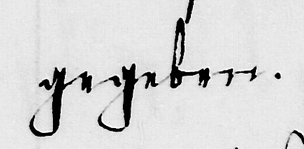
gegeben.
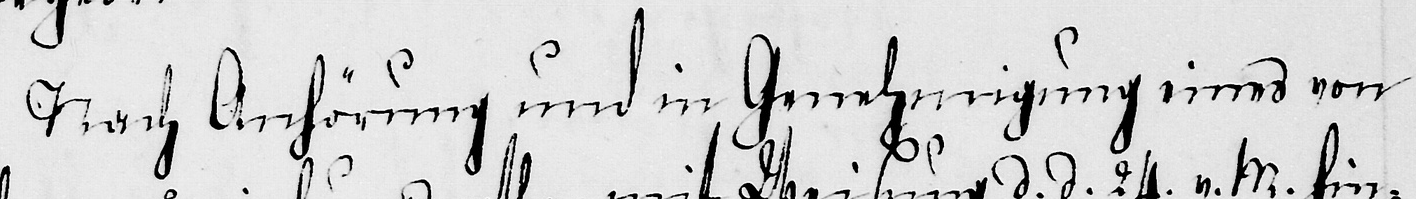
Nach Anhörung und in Genehmigung eines von
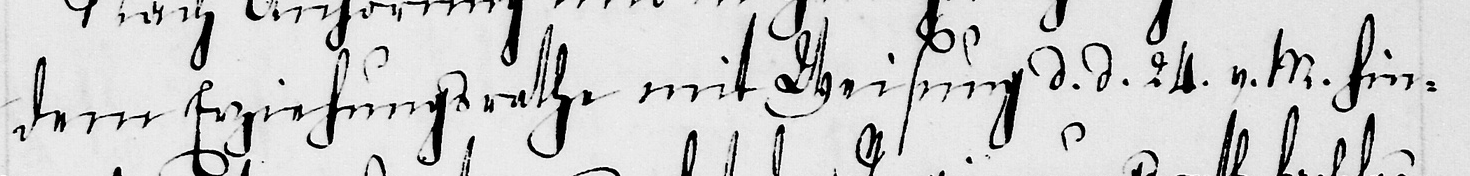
dem Erziehungsrathe mit Weisung d. d. 24. v. M. hin¬
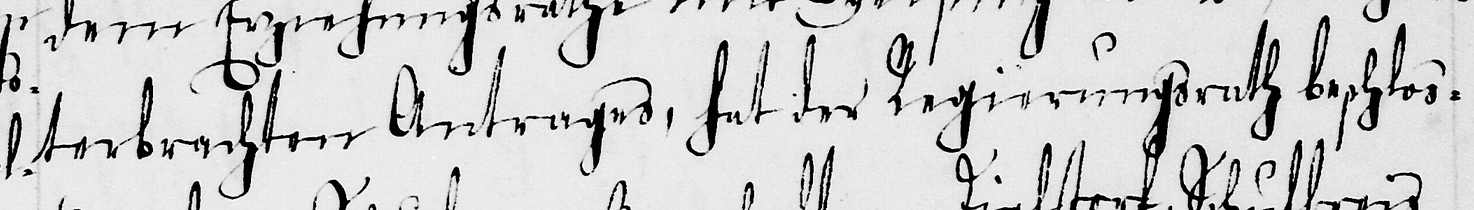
terbrachten Antrages, hat der Regierungsrath beschloß¬
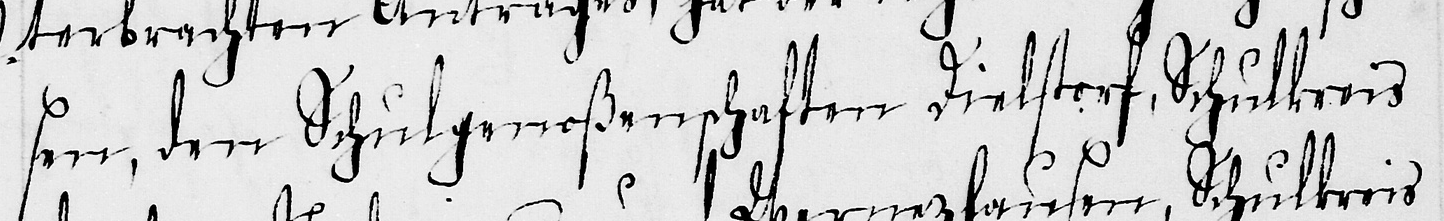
en, den Schulgenoßenschaften Dielstorf, Schulkreis
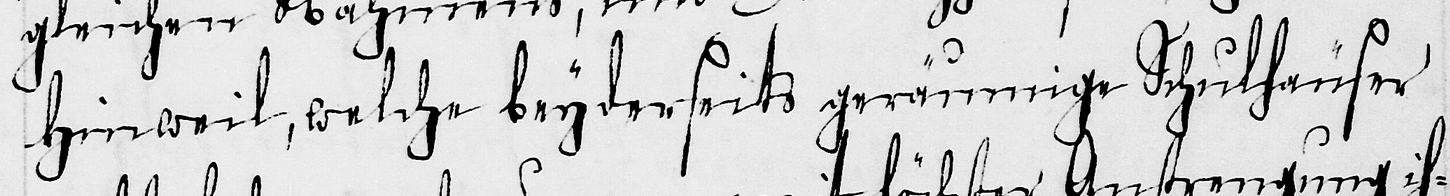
Hinweil, welche beyderseits geräumige Schulhäuser
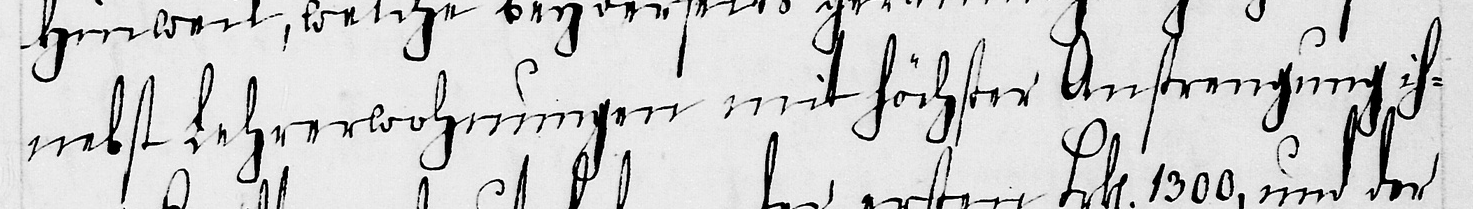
nebst Lehrerwohnungen mit höchster Anstrengung ih¬
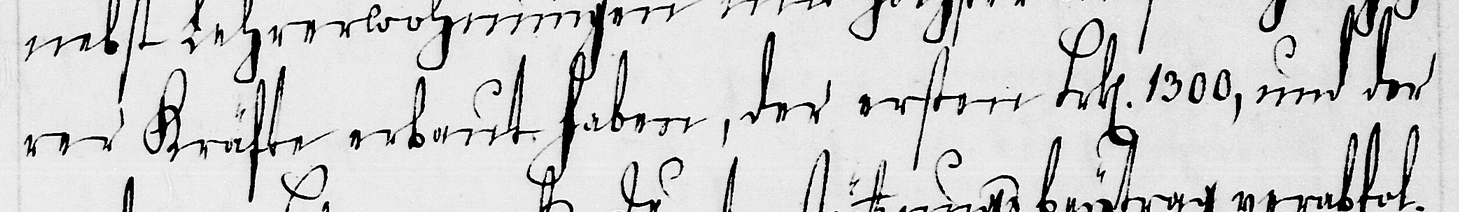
rer Kräfte erbaut haben, der ersten Frk. 1300, und der
